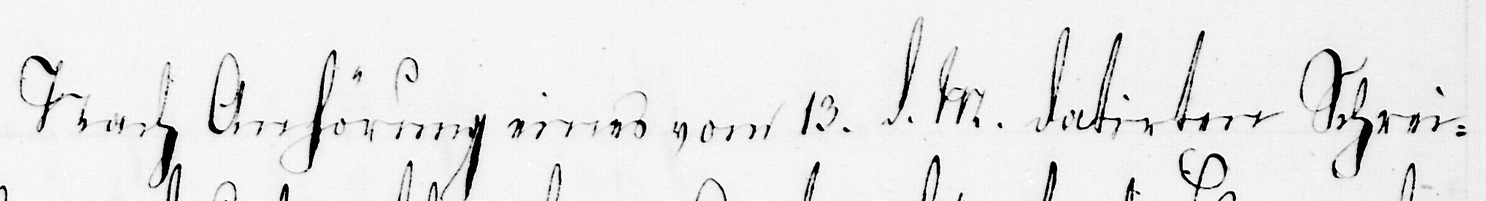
Nach Anhörung eines vom 13. d. M. datirten Schrei¬
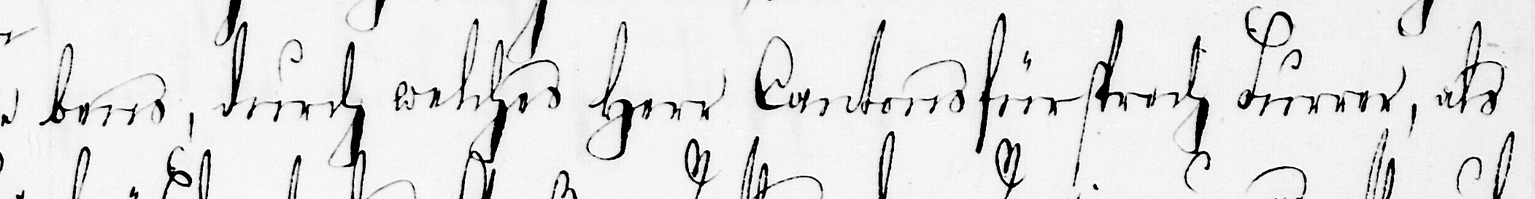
bens, durch welches Herr Cantonsfürsprech Furrer, als
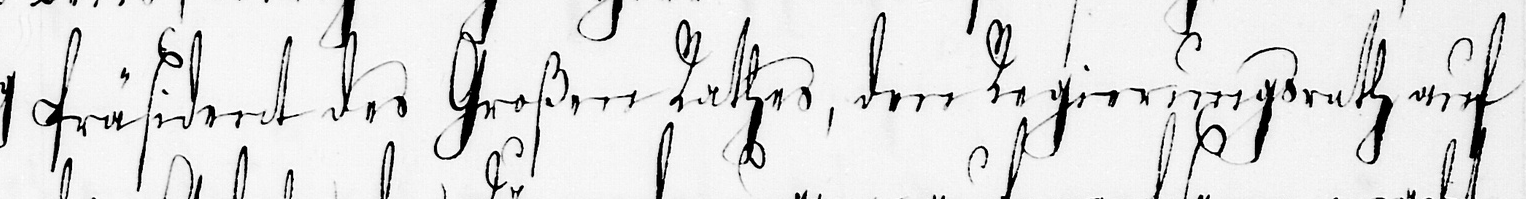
Präsident des Großen Rathes, den Regierungsrath auf
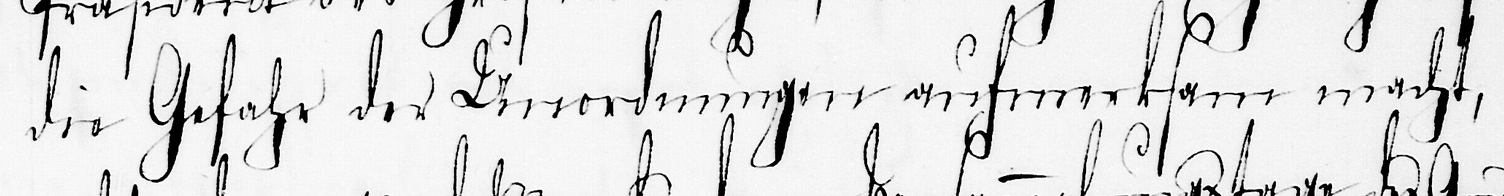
die Gefahr der Unordnungen aufmerksam macht,
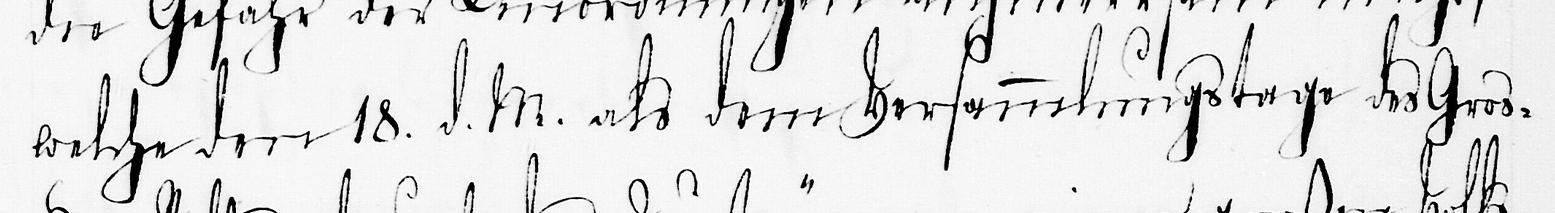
welche den 18. d. M. als dem Versammlungstage des Gro¬
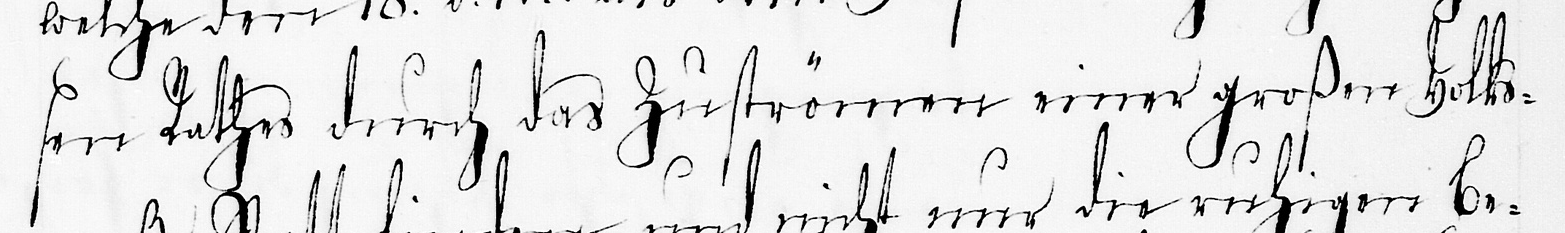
ßen Rathes durch das Zuströmen einer großen Volks¬
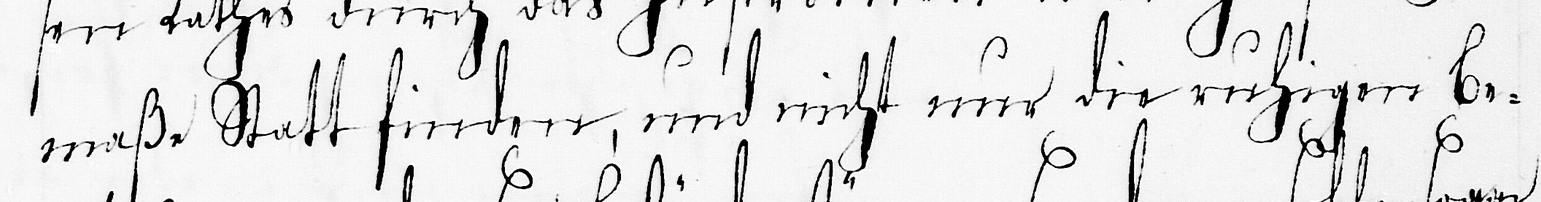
maße Statt finden, und nicht nur die ruhigen Be¬
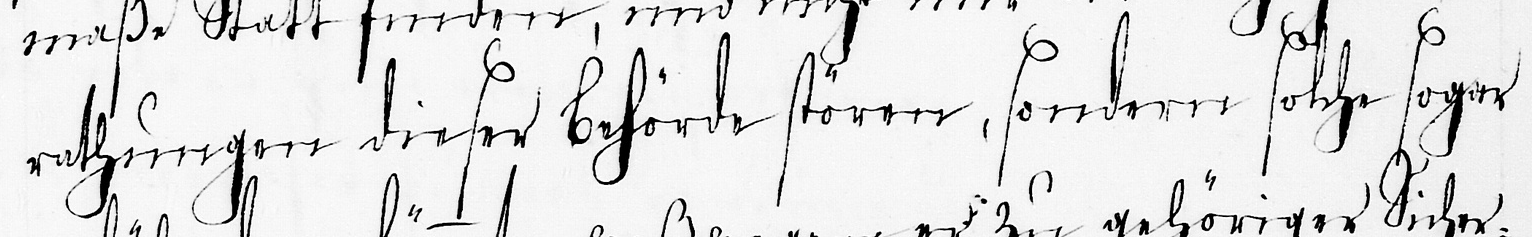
rathungen dieser Behörde stören, sondern solche sogar
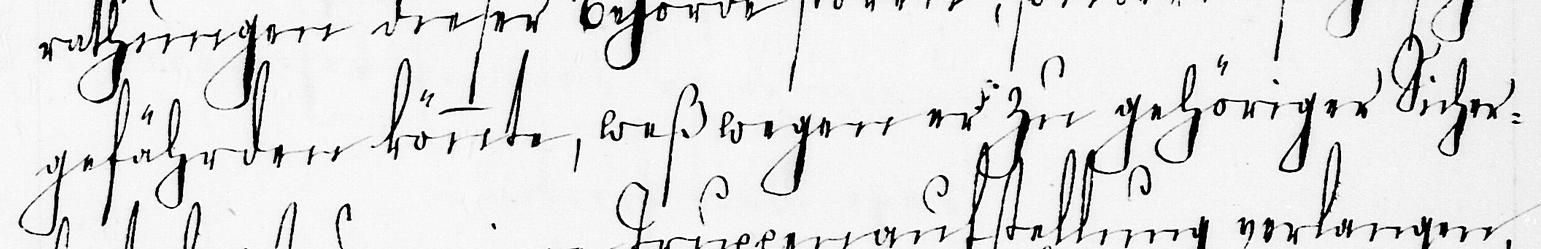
gefährden könnte, weßwegen er zu gehöriger Sicher¬
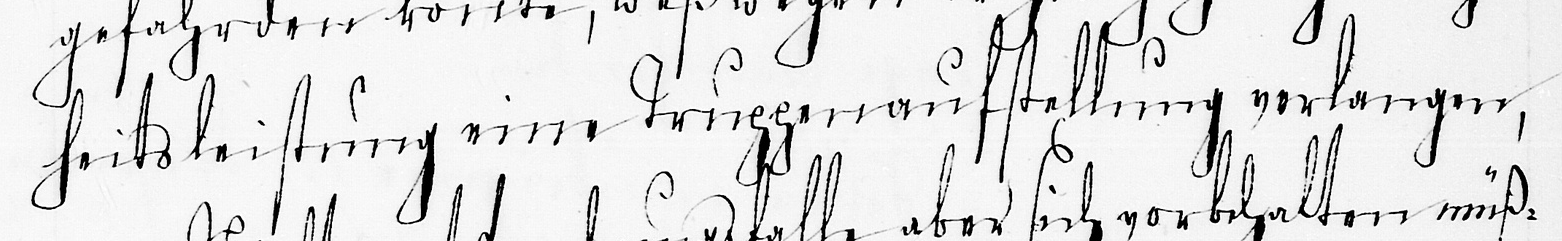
heitsleistung eine Truppenaufstellung verlangen,
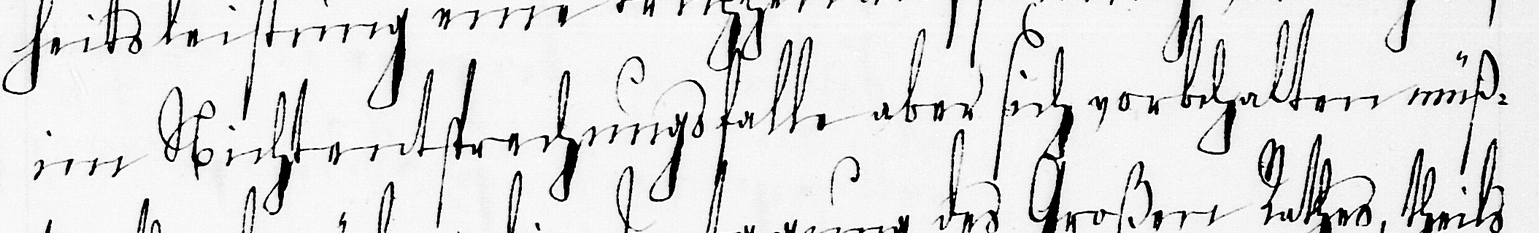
im Nichtentsprechungsfalle aber sich vorbehalten müß¬
